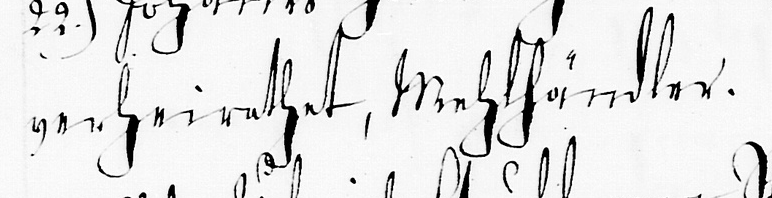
verheirathet, Mehlhändler.
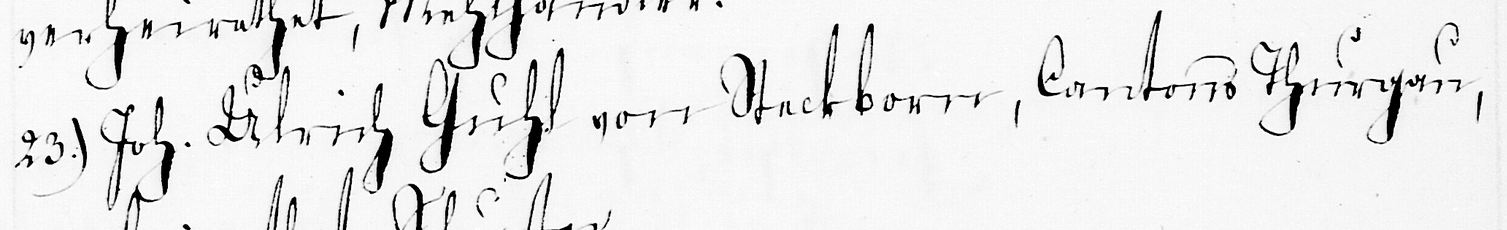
23.) Joh. Ulrich Guhl von Steckborn, Cantons Thurgau,
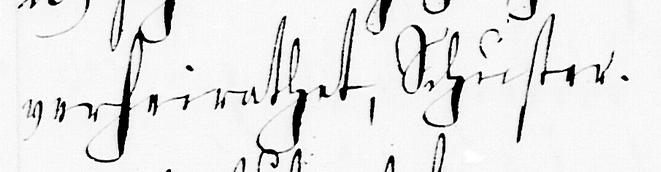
verheirathet, Schuster.
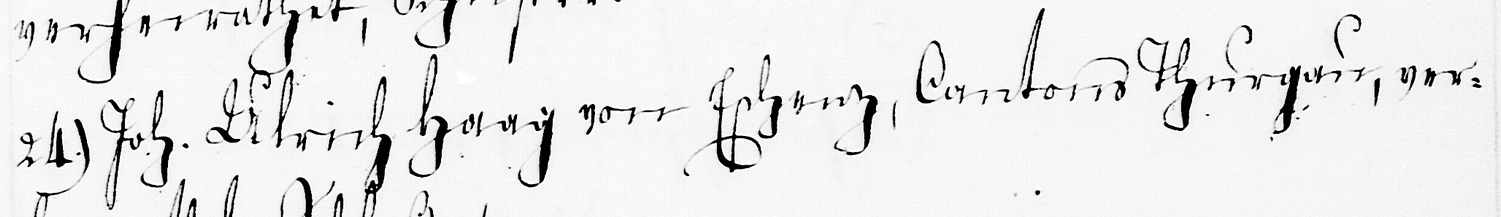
24.) Joh. Ulrich Haag von Eschenz, Cantons Thurgau, ver¬
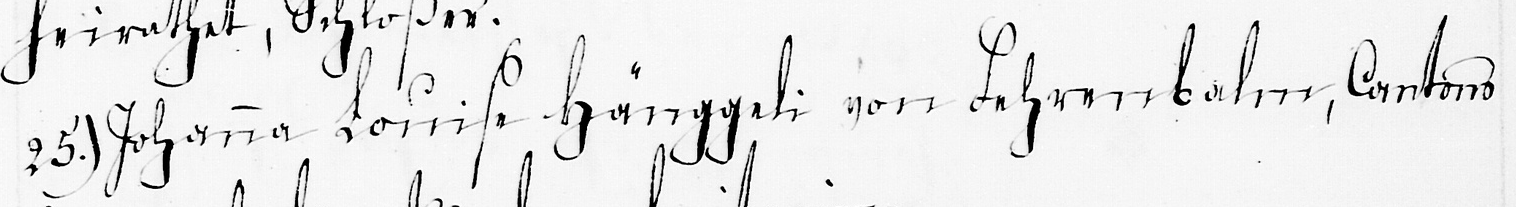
25.) Johanna Louise Hänggeli von Fehrenbalm, Cantons
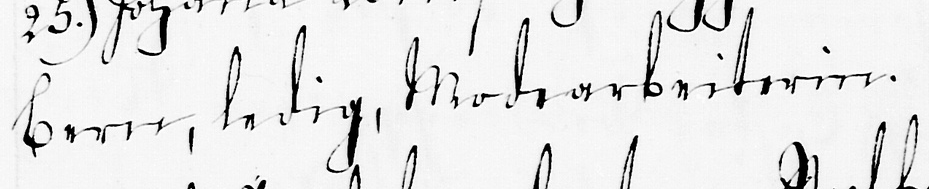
Bern, ledig, Modearbeiterin.
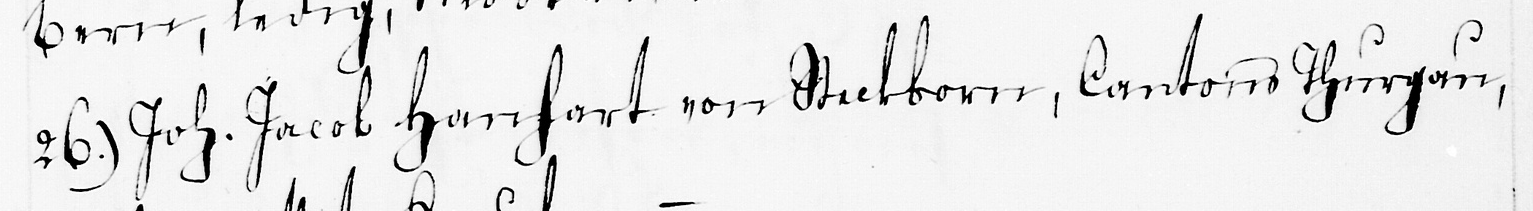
26.) Joh. Jacob Hanhart von Steckborn, Cantons Thurgau,
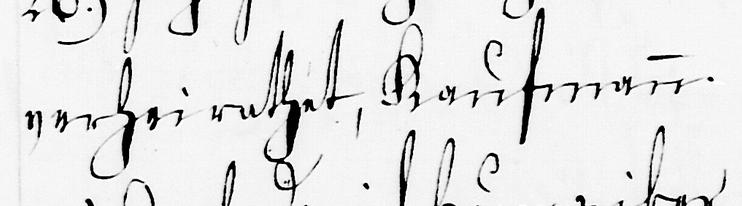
verheirathet, Kaufmann.
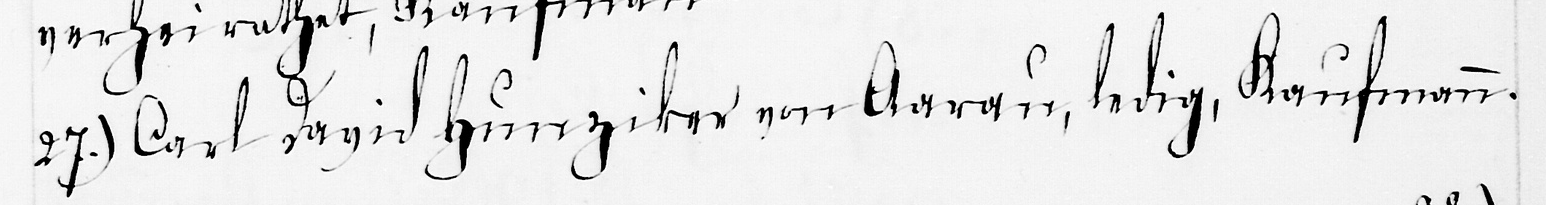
27.) Carl David Hunziker von Aarau, ledig, Kaufmann.
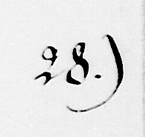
21.)
